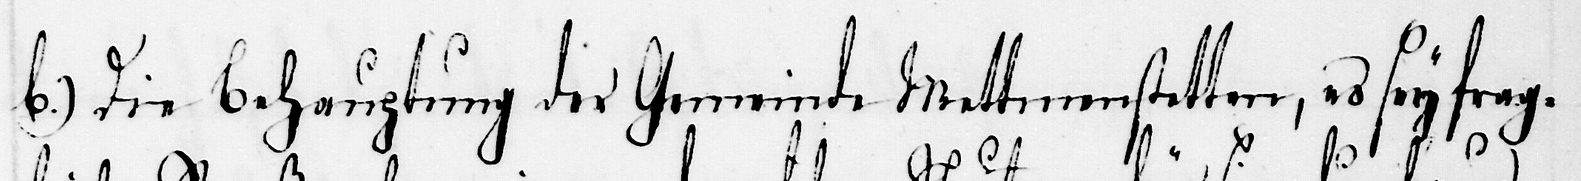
b.) Die Behauptung der Gemeinde Mettmenstetten, es sey frag¬
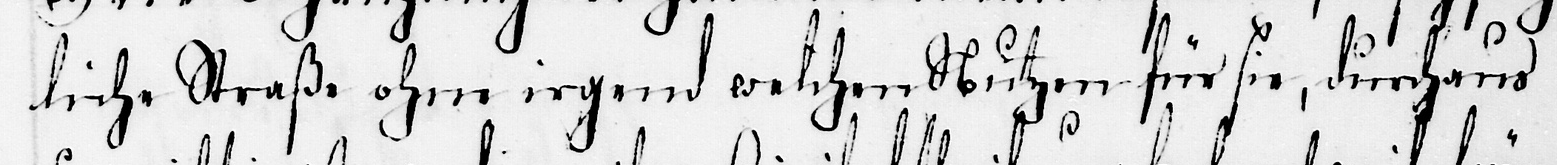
liche Straße ohne irgend welchen Nutzen für sie, durchaus
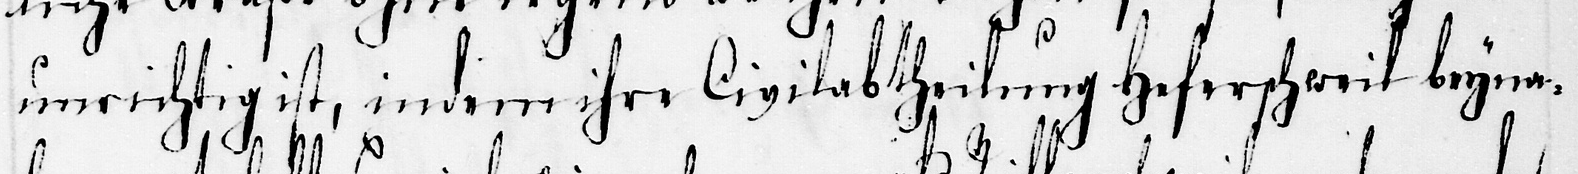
unrichtig ist, indem ihre Civilabtheilung Heferschweil beyna¬
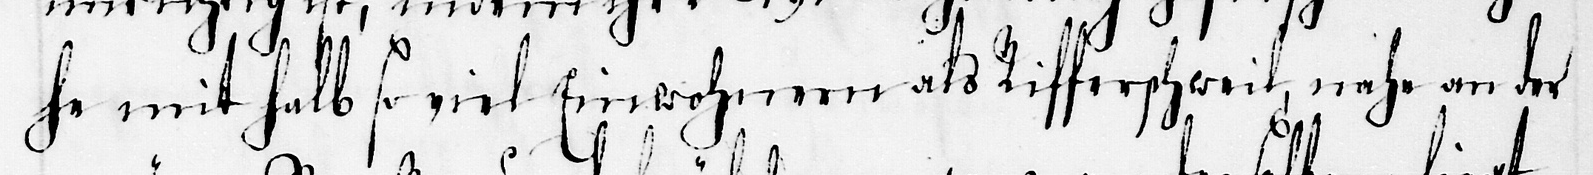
he mit halb so viel Einwohnern als Rifferschweil, nahe an der
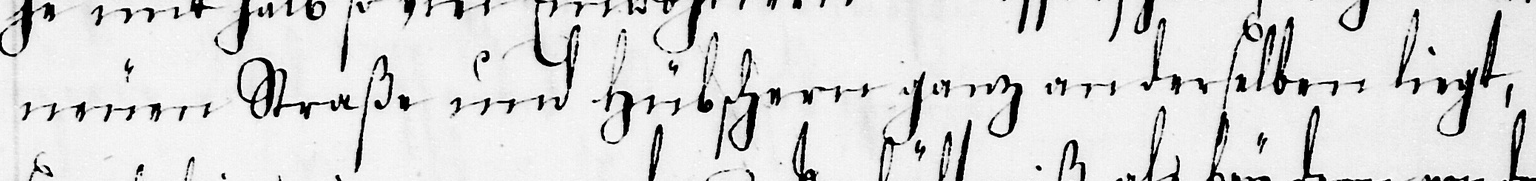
neuen Straße und Hübschern ganz an derselben liegt,
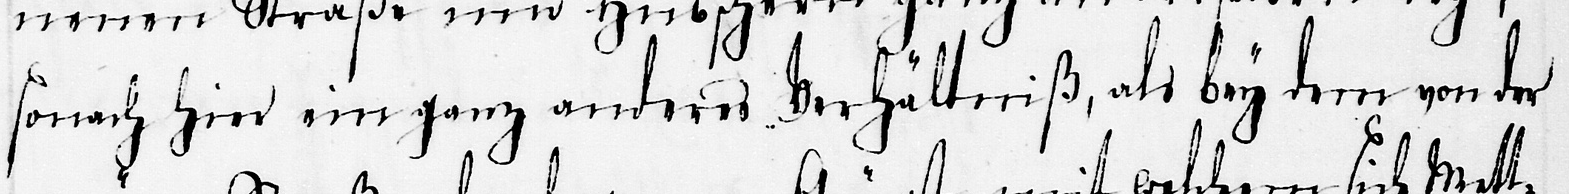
sonach hier ein ganz anderes Verhältniß, als bey dem von der
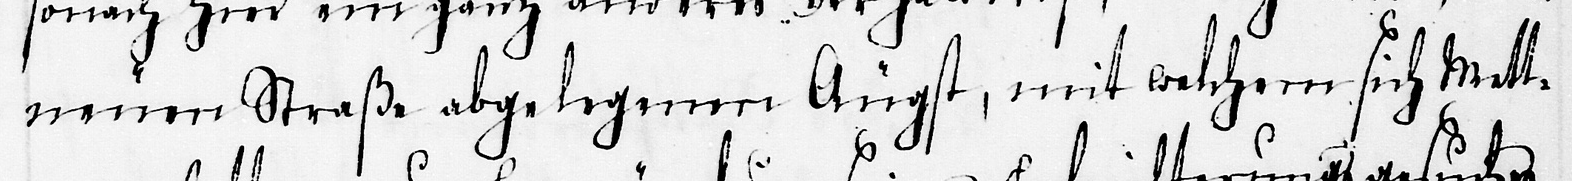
neuen Straße abgelegenen Äugst, mit welchem sich Mett¬
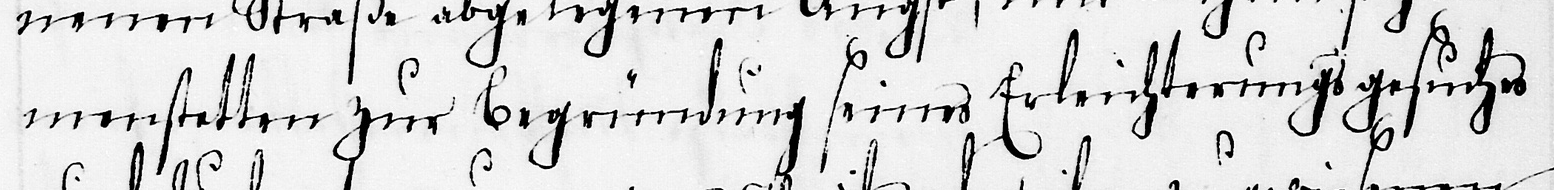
menstetten zur Begründung seines Erleichterungsgesuches
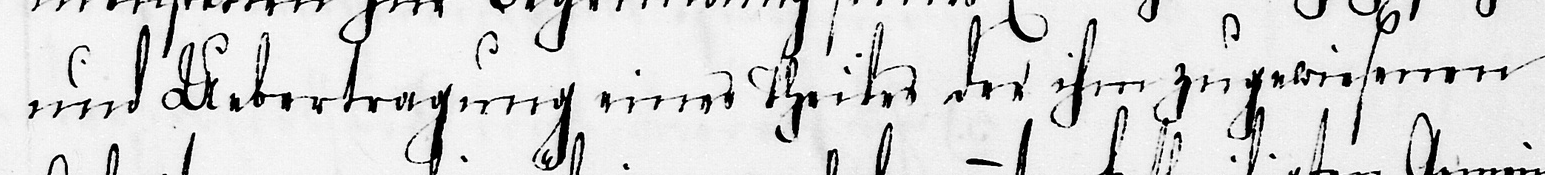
und Uebertragung eines Theiles der ihm zugewiesenen
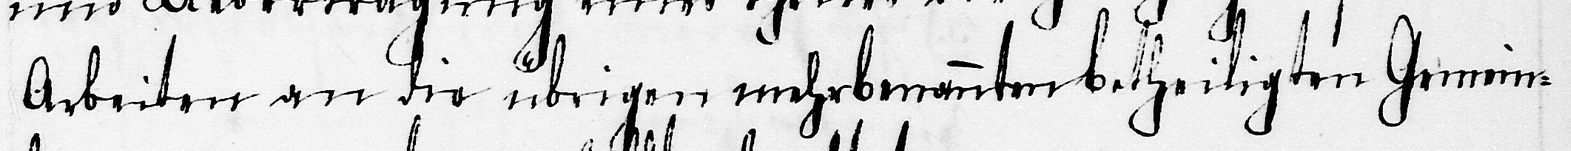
Arbeiten an die übrigen mehrbenannten betheiligten Gemein¬
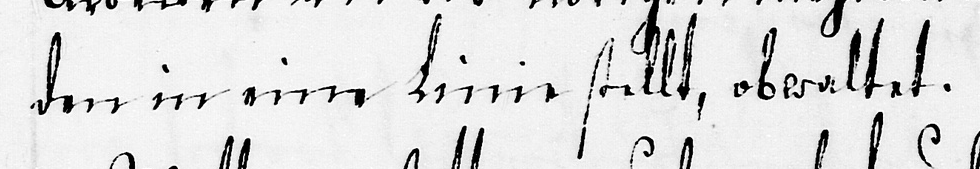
den in eine Linie stellt, obwaltet.
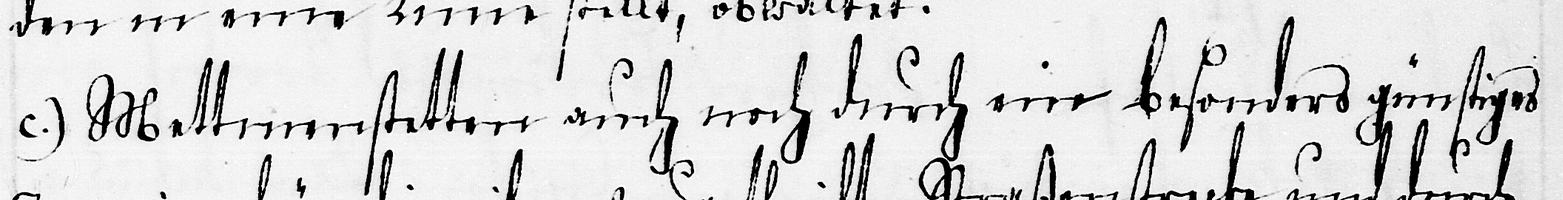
c.) Mettmenstetten auch noch durch ein besonders günstiges
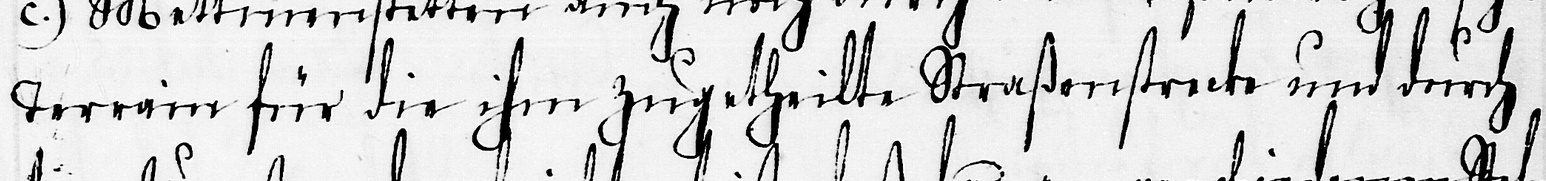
Terrain für die ihm zugetheilte Straßenstrecke und durch
